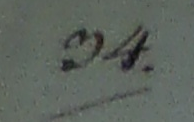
34.
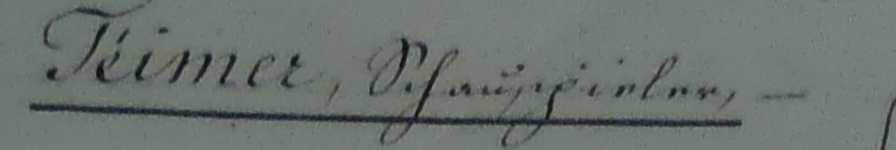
Téimer, Schauspieler, _
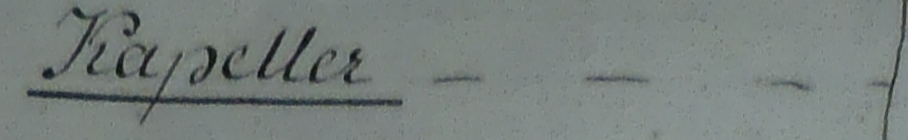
Kapeller _ _ _
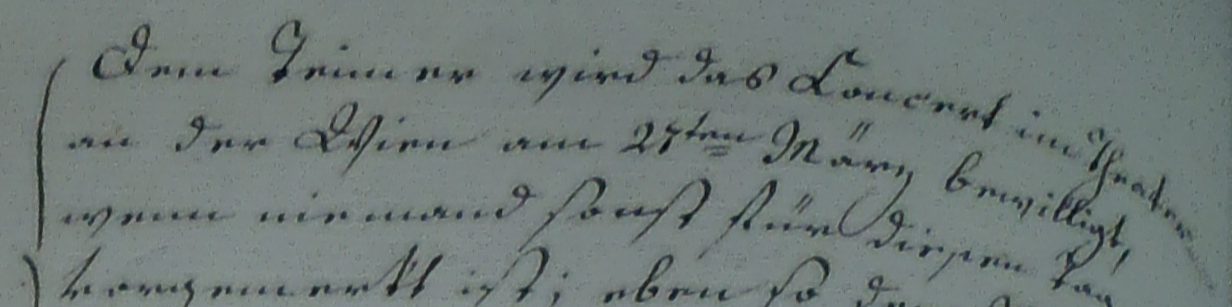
Dem Teimer wird das Concert im Theater
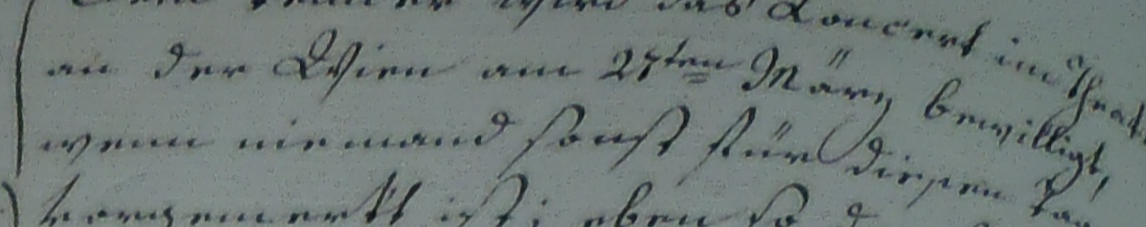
an der Wien am 27te͇n März bewilligt,
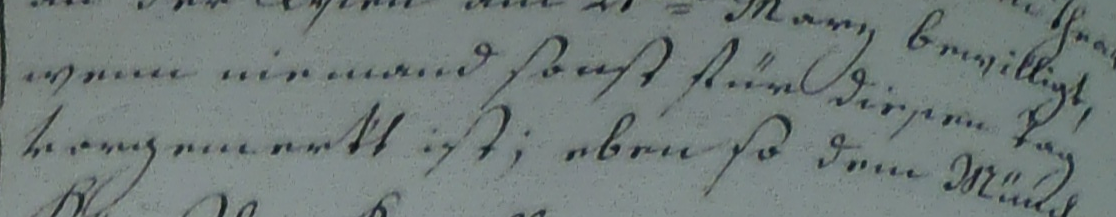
wenn niemand sonst für diesen Tag
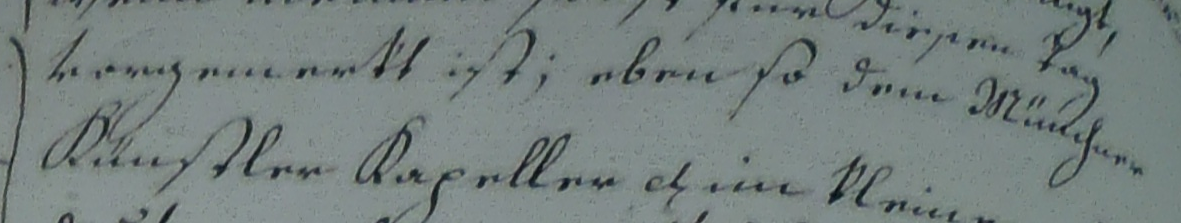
vorgemerkt ist; eben so dem Münchner
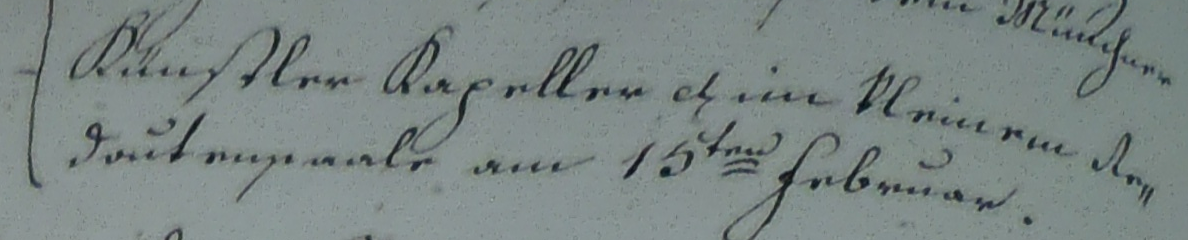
Künstler Kapeller etc im kleinem Re¬
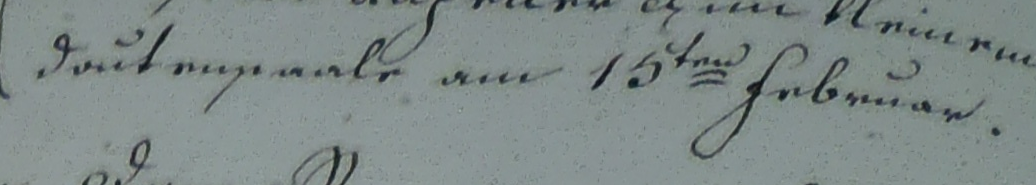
doutensaale am 15te͇n Februar.
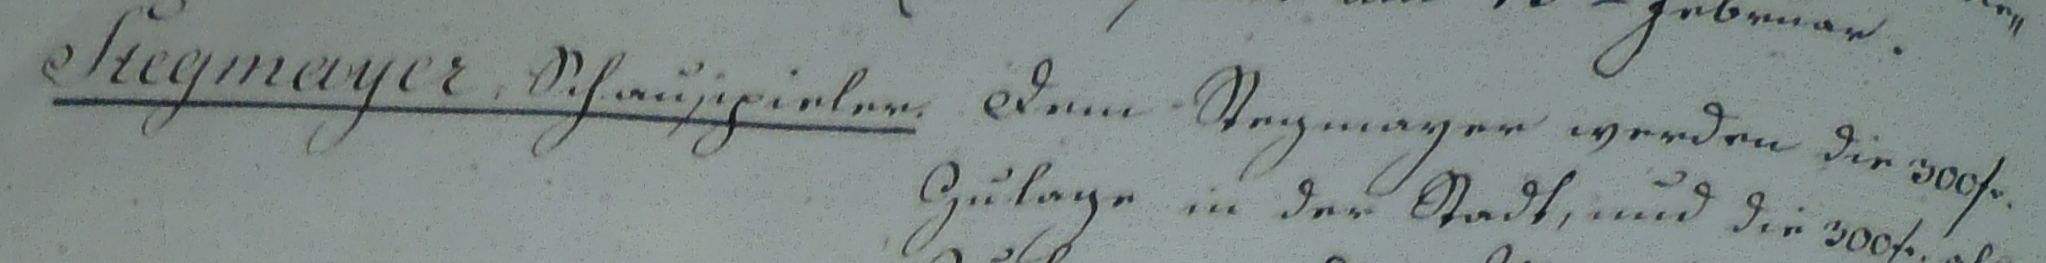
Stegmayer, Schauspieler. Dem Stegmayer werden die 300fr.
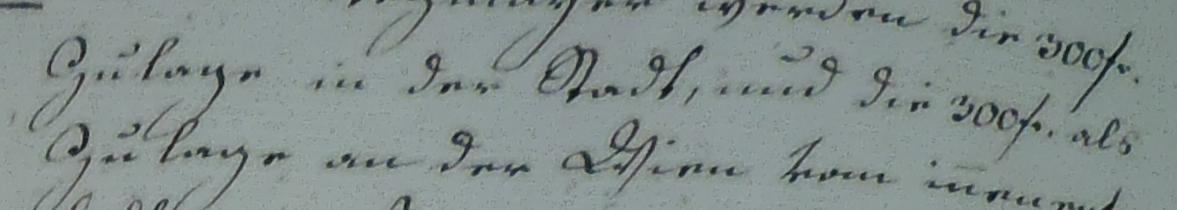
Zulage in der Stadt, und die 300fr. als
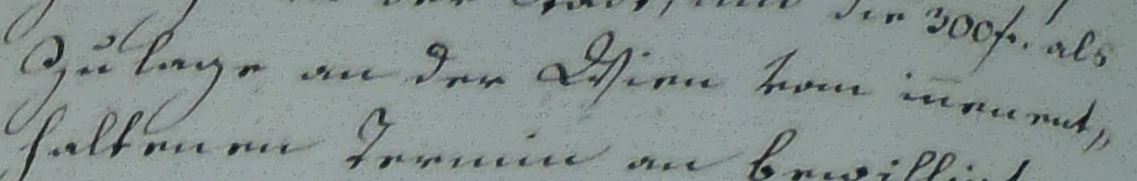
Zulage an der Wien vom in̅enent¬
